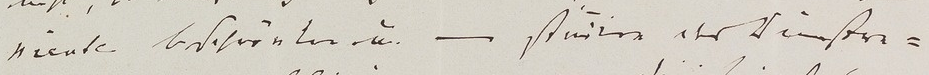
niente beschränken u. – studire das Dienstre-
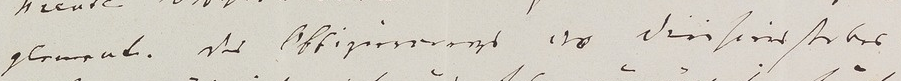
glement. Das Offiziercorps des Divisionsstabes
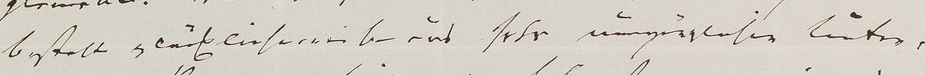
besteht glücklicherweise aus sehr umgänglichen Leuten,
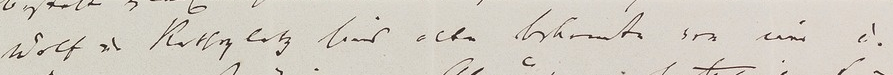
Wolf u. Rothpletz sind alte Bekannte von mir u.
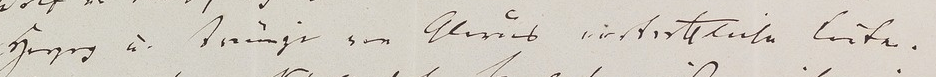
Herzog u. Trümpi von Glarus vortreffliche Leute.
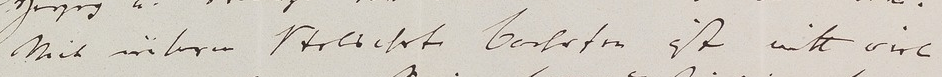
Mit unserm Stabschef Bachofen ist nicht viel
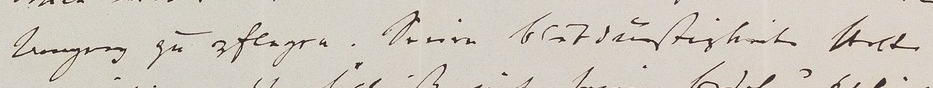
Umgang zu pflegen. Seine Blutdünstigkeit steht
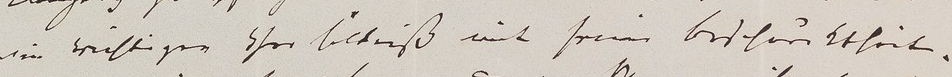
im richtigen Verhältniß mit seiner Beschränktheit.
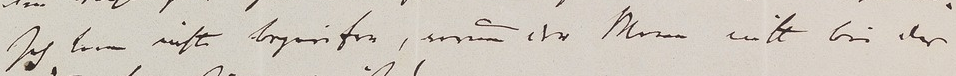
Ich kann nicht begreifen, warum der Mann nicht bei der
